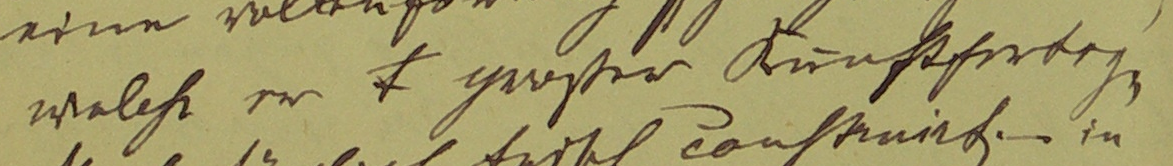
welche er mit großer Kunstfertig¬
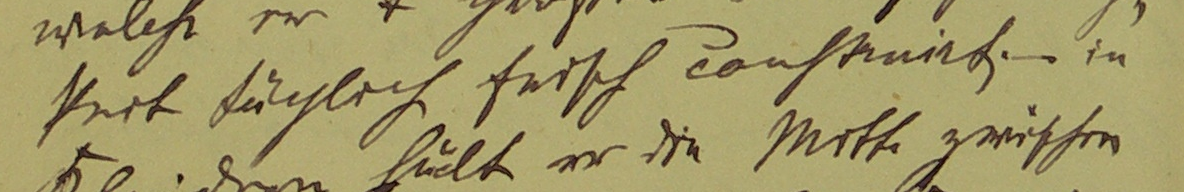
keit täglich frisch construirte .- in
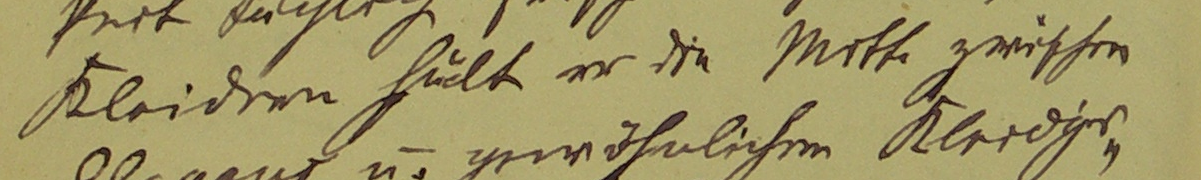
Kleidern hält er die Mitte zwischen
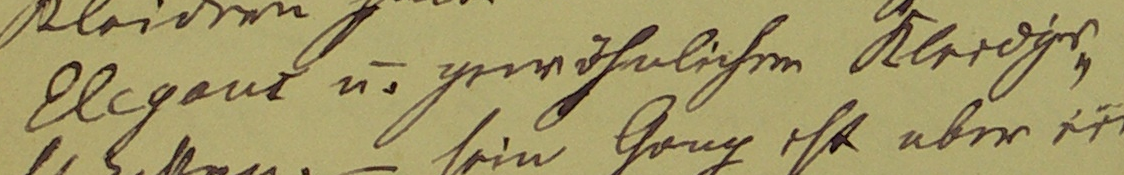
Eleganz Und gewöhnlichen Kleidungs¬
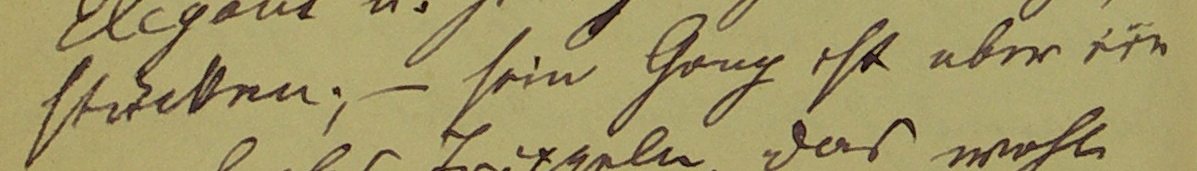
stücken;- sein Gang ist aberein
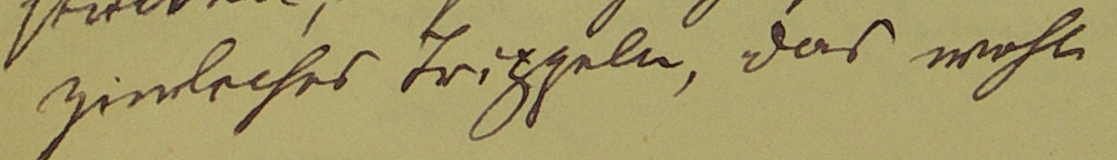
ziemliches Trippeln, das wohl
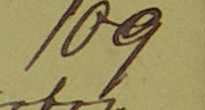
109
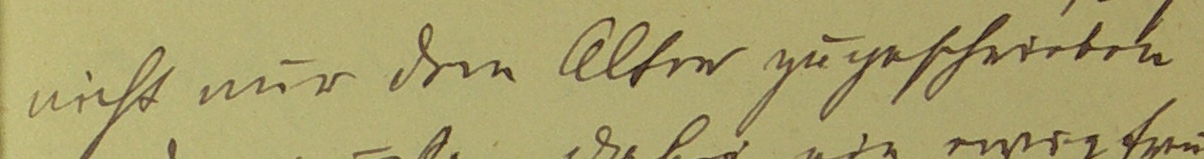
nicht nur dem Alter zugeschrieben
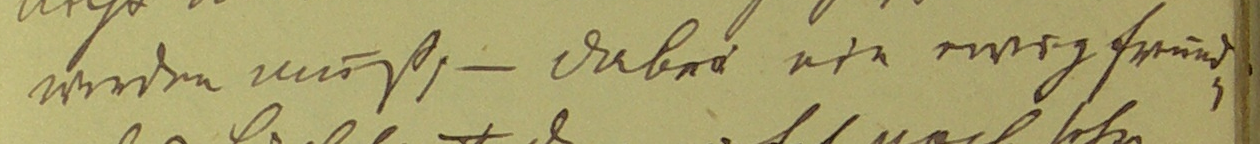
werden mußte;- dabei ein ewig freund¬
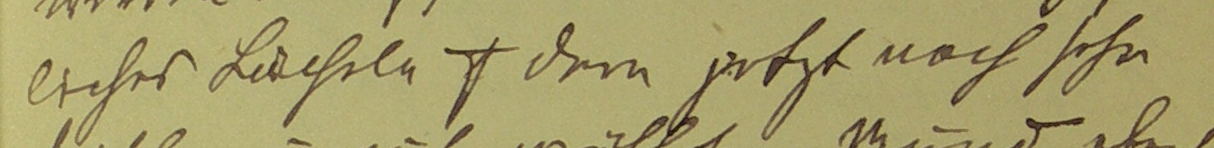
liches Lächeln mit dem jetzt noch sehr
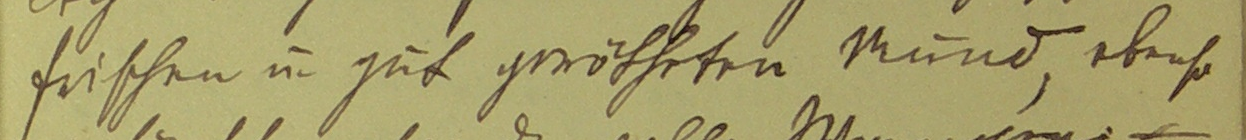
frischen und gut gewölbten Mund, ebenso
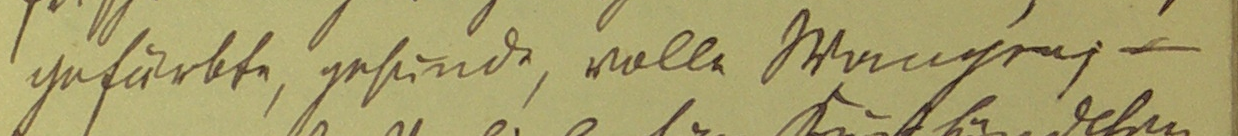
gefärbte , gesunde, volle Wangen—
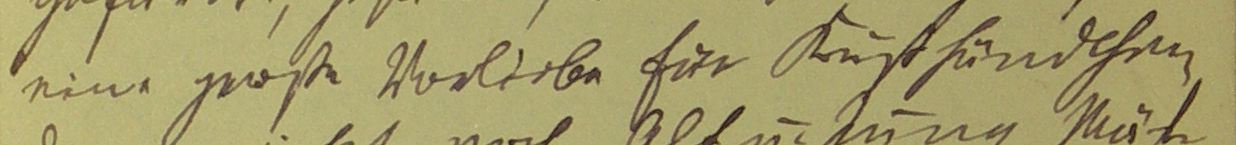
eine große Vorliebe für Kusshändchen
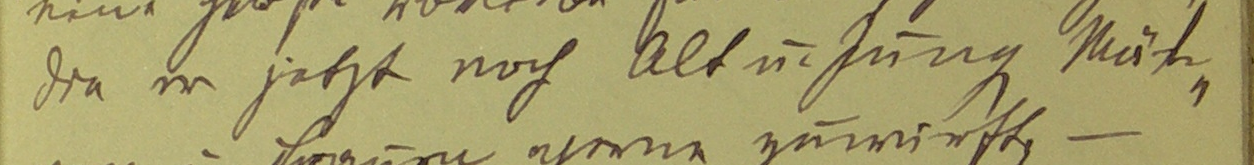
die er jetzt noch Alt und Jung, Mädch¬
